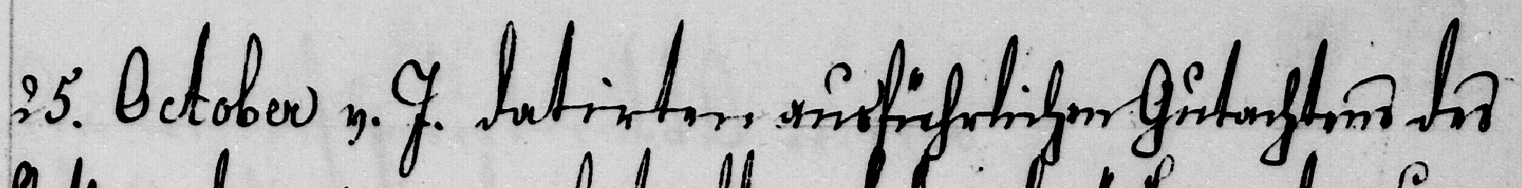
25. October v. J. datirten ausführlichen Gutachtens des
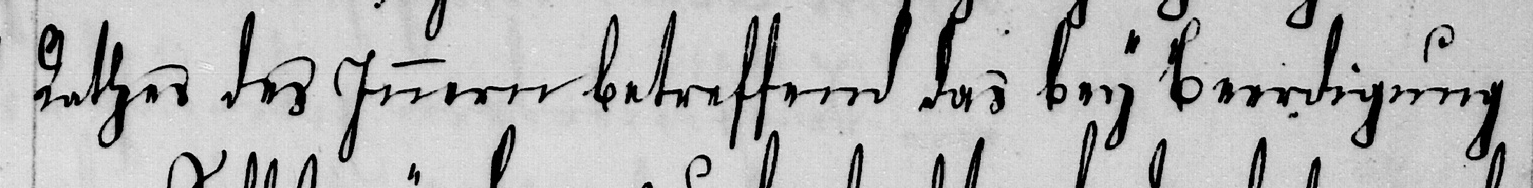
Rathes des Innern betreffend das bey Beerdigung
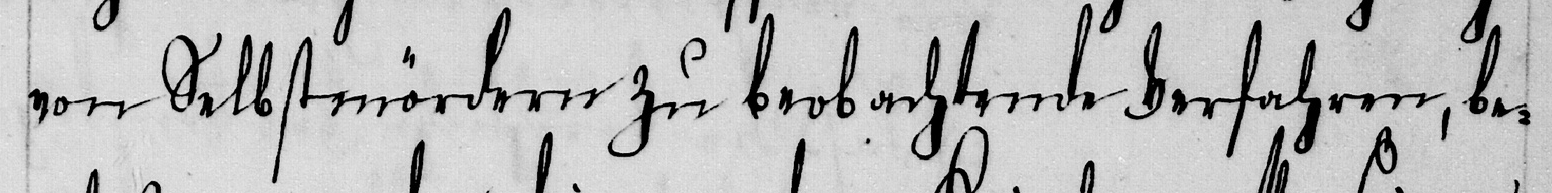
von Selbstmördern zu beobachtende Verfahren, bes¬
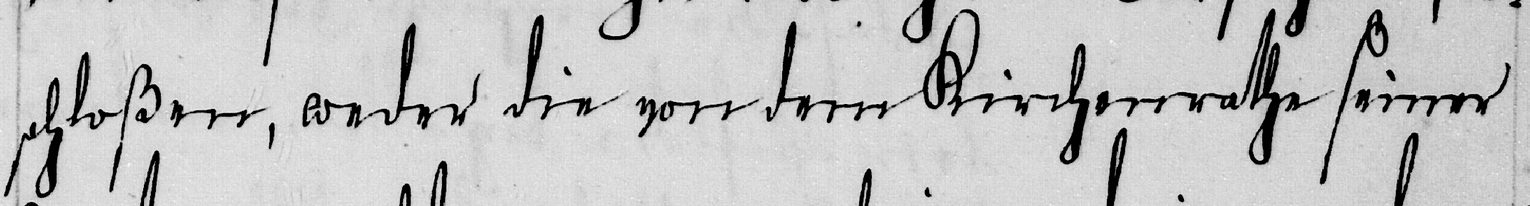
chloßen, weder die von dem Kirchenrathe seiner
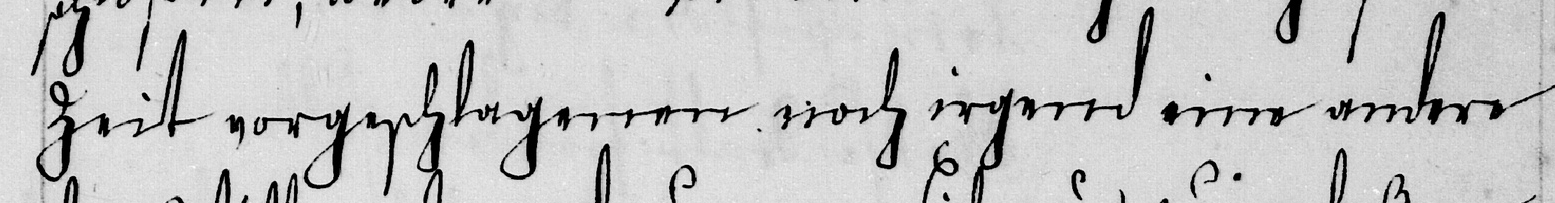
Zeit vorgeschlagenen noch irgend eine andere
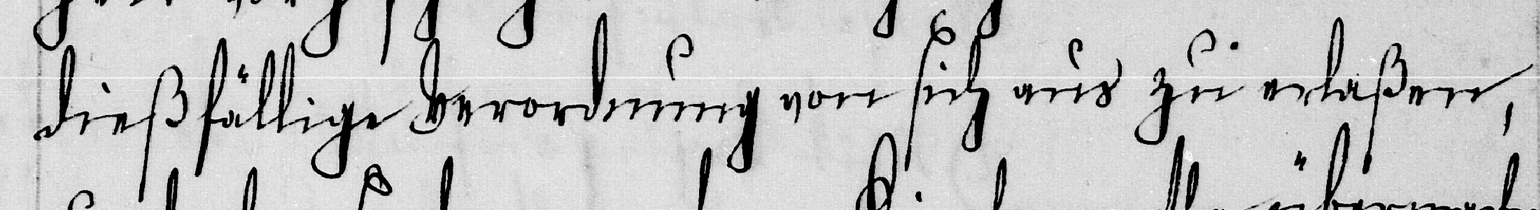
dießfällige Verordnung von sich aus zu erlaßen,
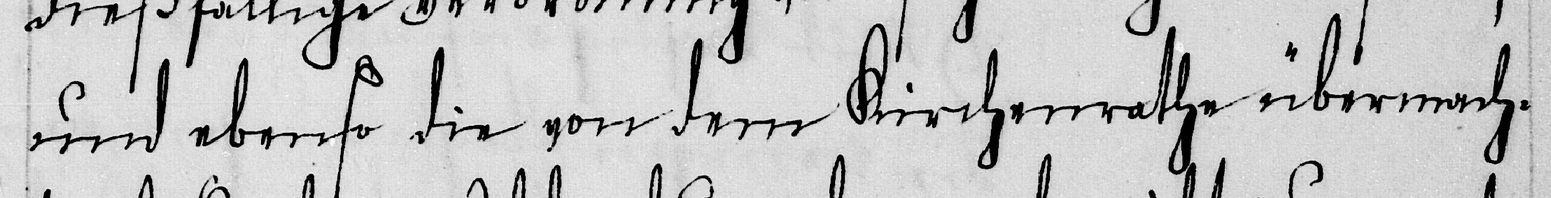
und ebenso die von dem Kirchenrathe übermach¬
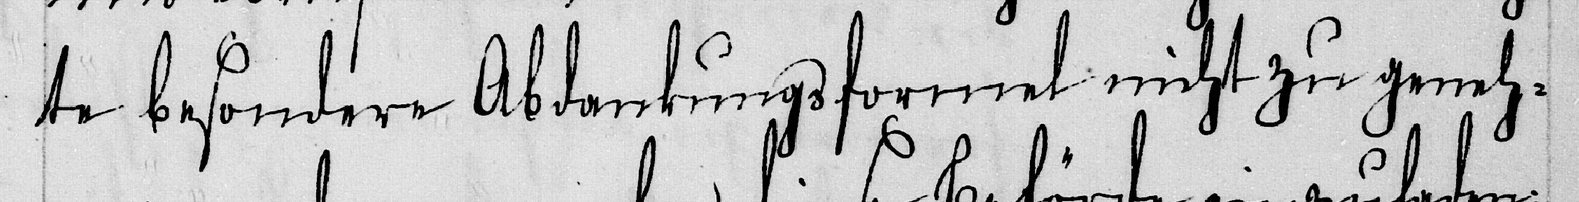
te besondere Abdankungsformel nicht zu geneh¬
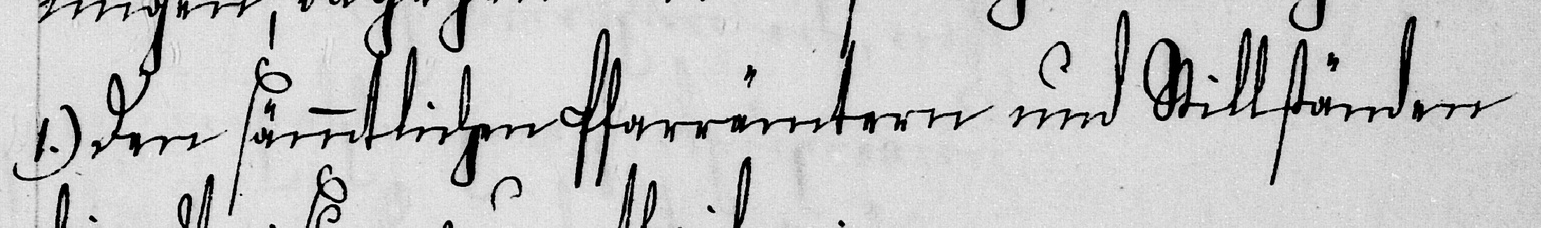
1.) Den sämmtlichen Pfarrämtern und Stillständen
